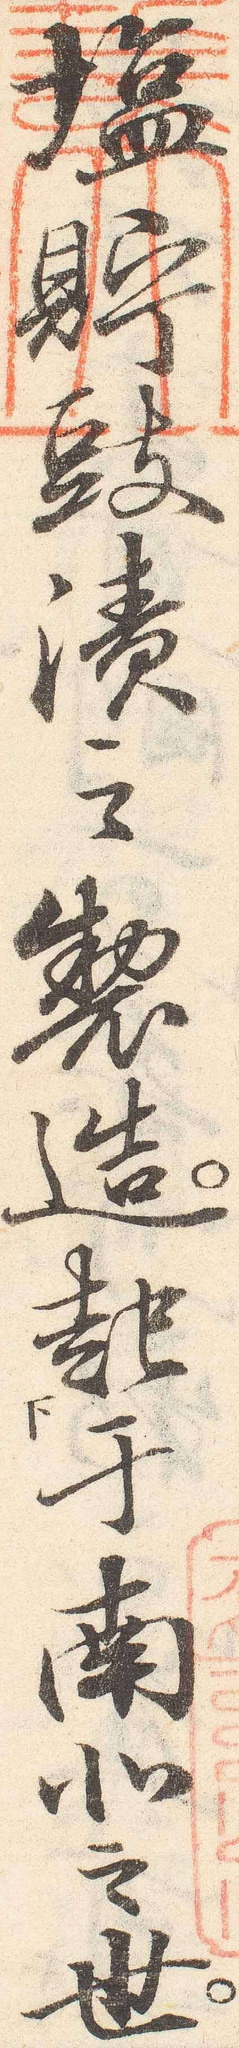塩貯豉漬之製造。起于南北之世。

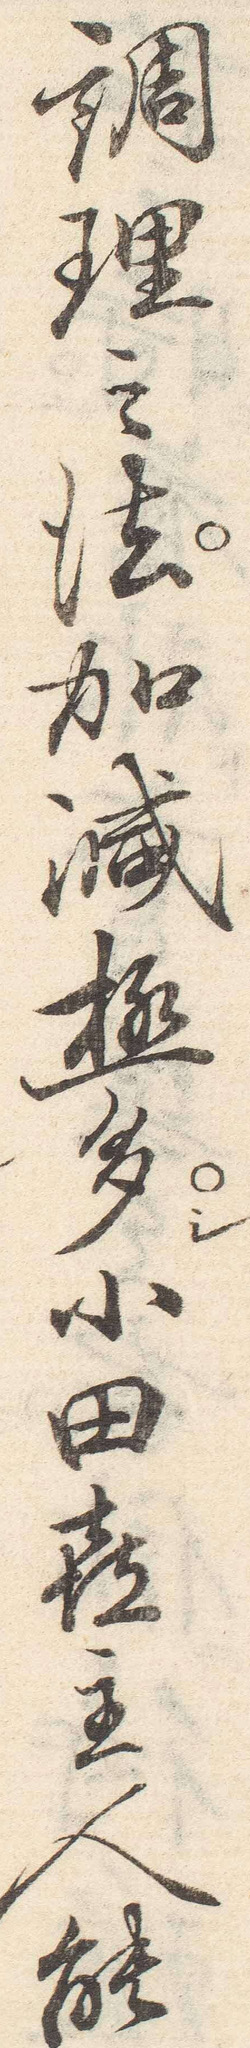調理之法。加減極多。小田喜主人能
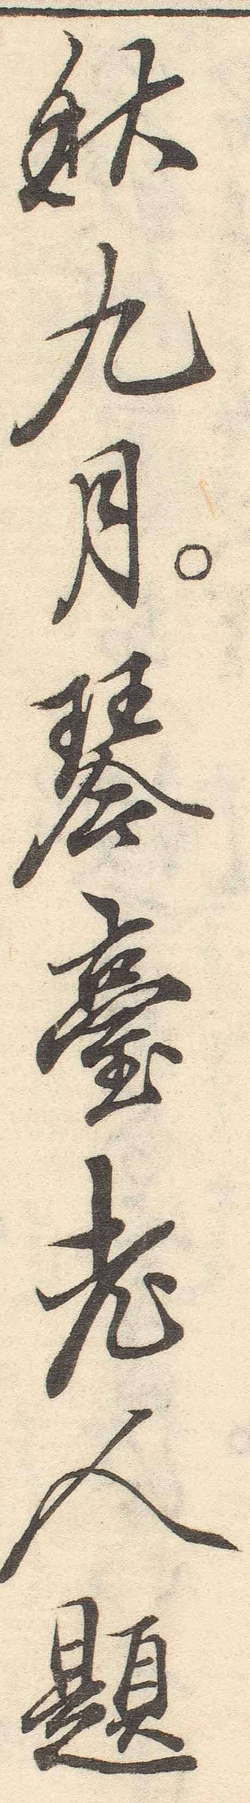秋九月。琴台老人題

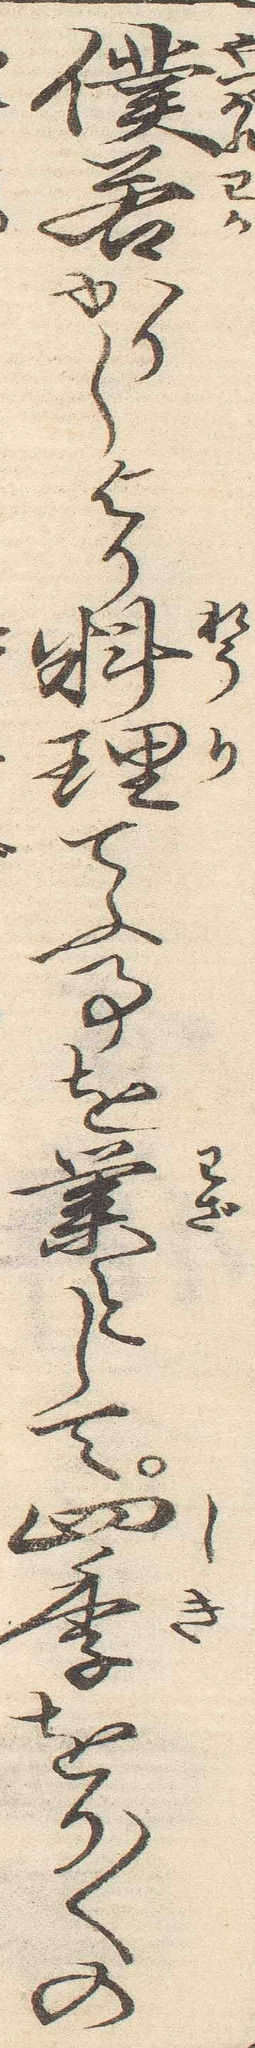僕若かりしより料理てふ事を業として。四季をり〳〵の
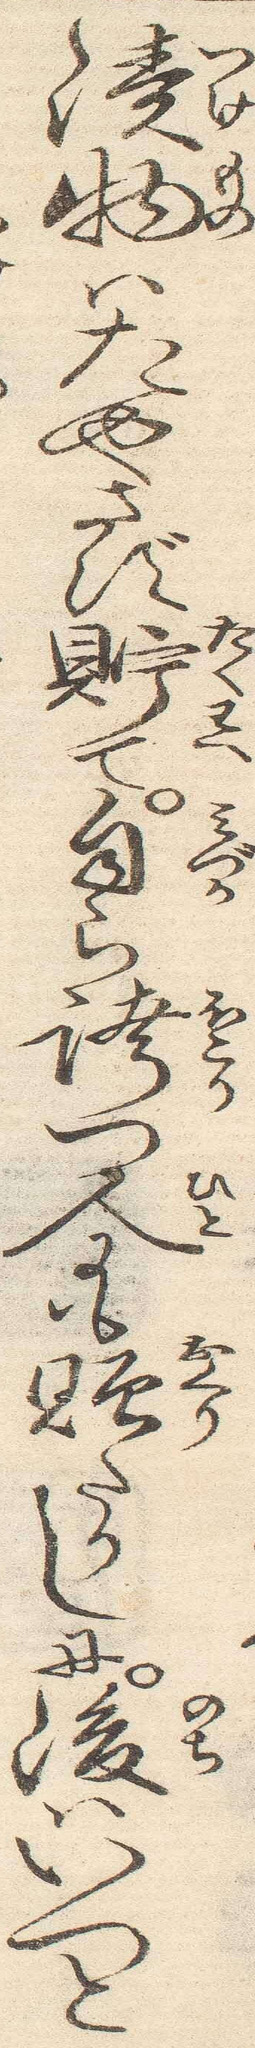漬物はたやさず貯て。自ら誇つ人にも贈たりしに。後はいつと
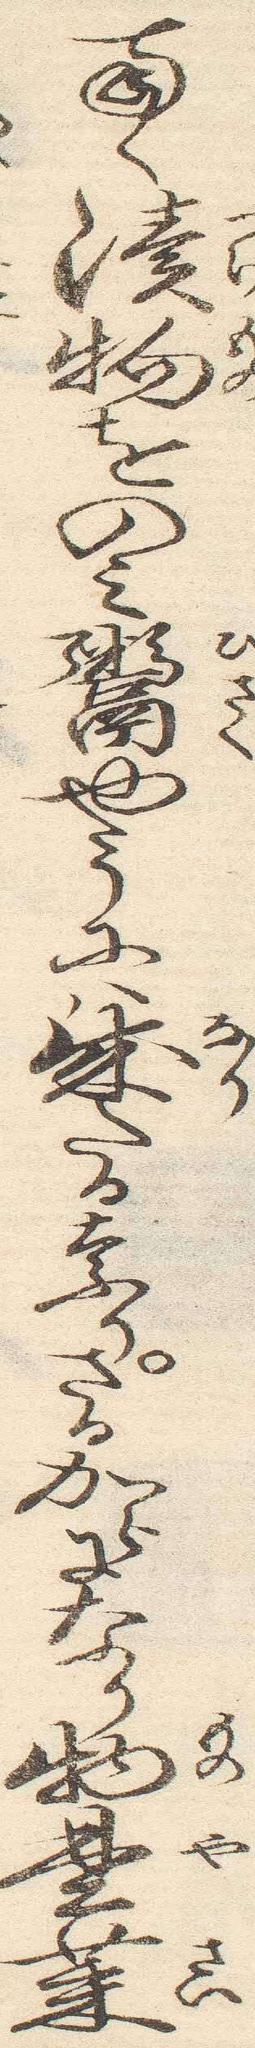なく漬物をのみ鬻やうには成たるなり。さるからになり物野菜
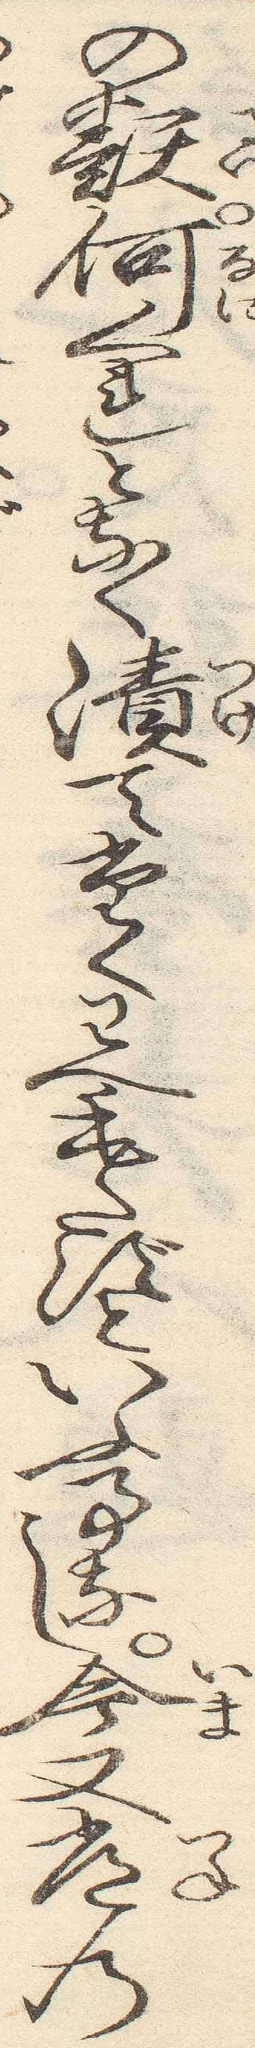の類。何くれとなく漬てたくわへもたずといふ事なし。今又常の
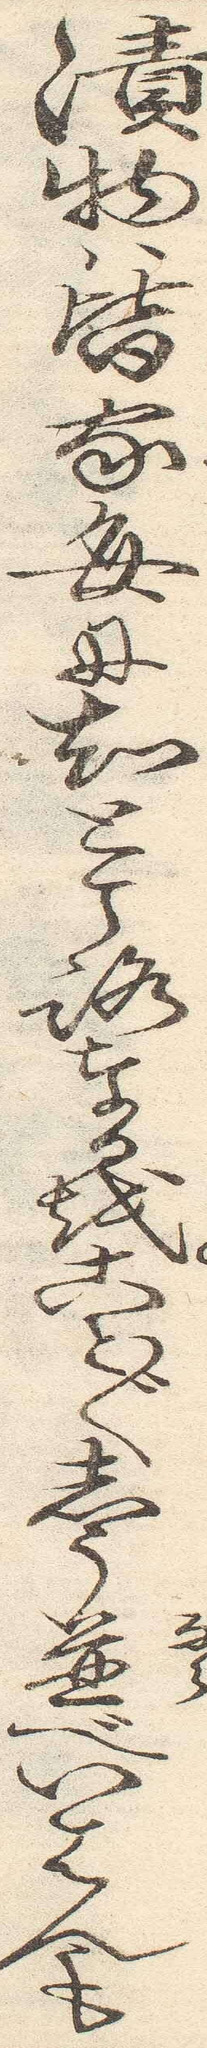漬物は皆家毎に知ところなるを。こと〴〵しう並べいはんも
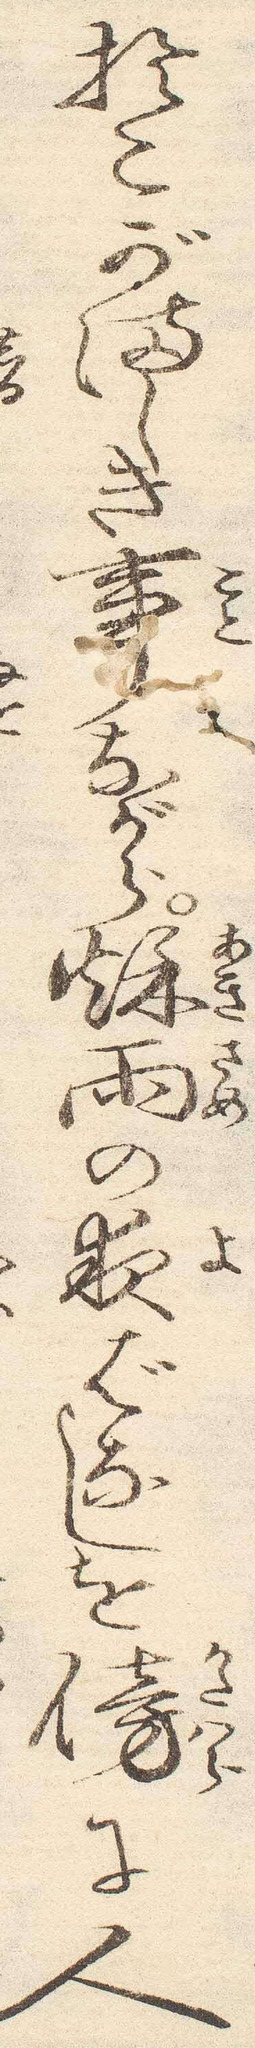おこがましき事ながら。秋雨の夜ばなしを傍に人
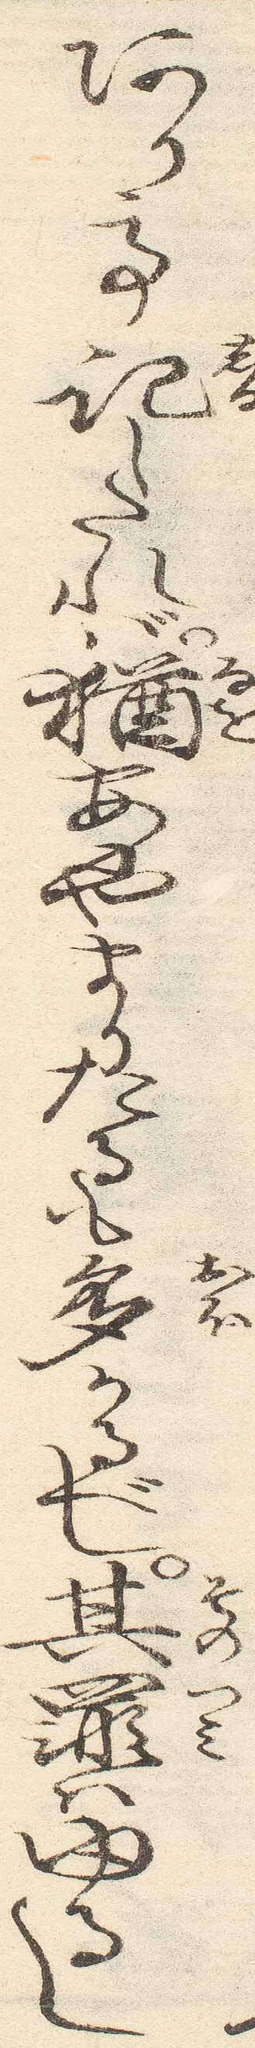ありて記したれば。猶あやまりたるも多かるべし。其罪はゆるし
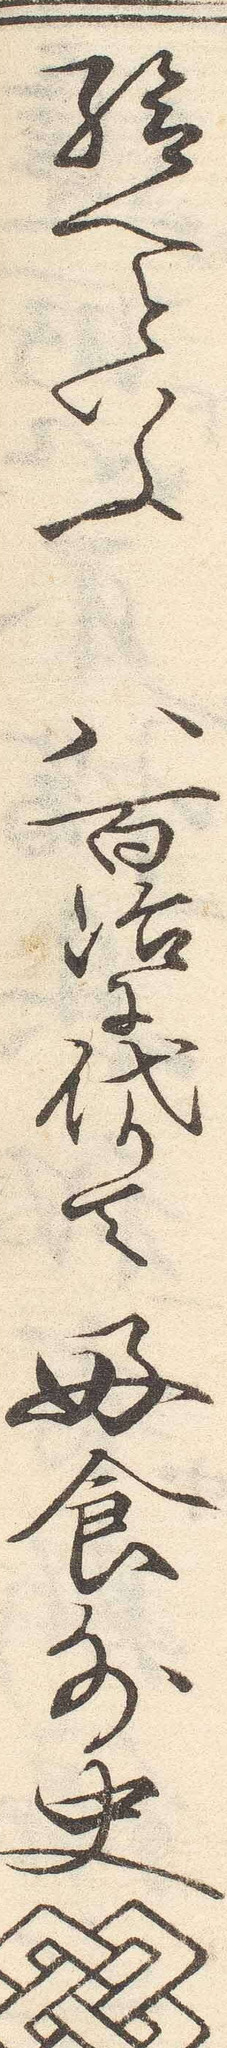給へといふ八百治に代りて好食外史
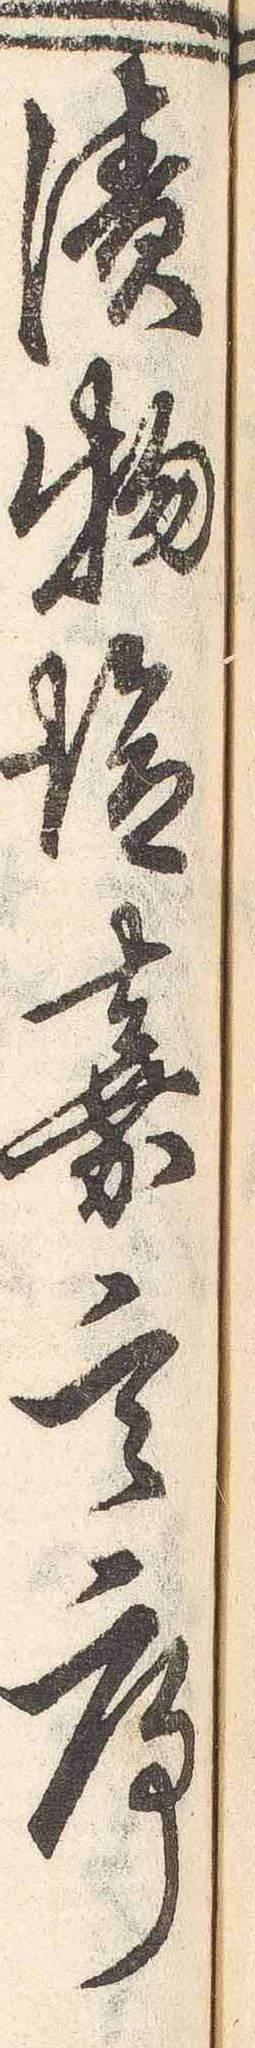漬物塩嘉言序
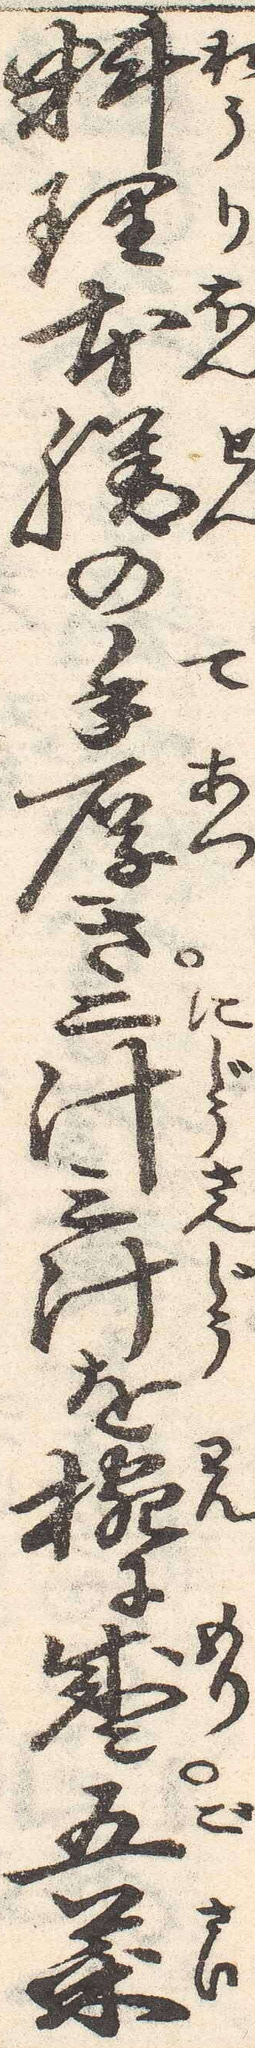料理本膳の手厚き。二汁三汁を椀に盛。五菜
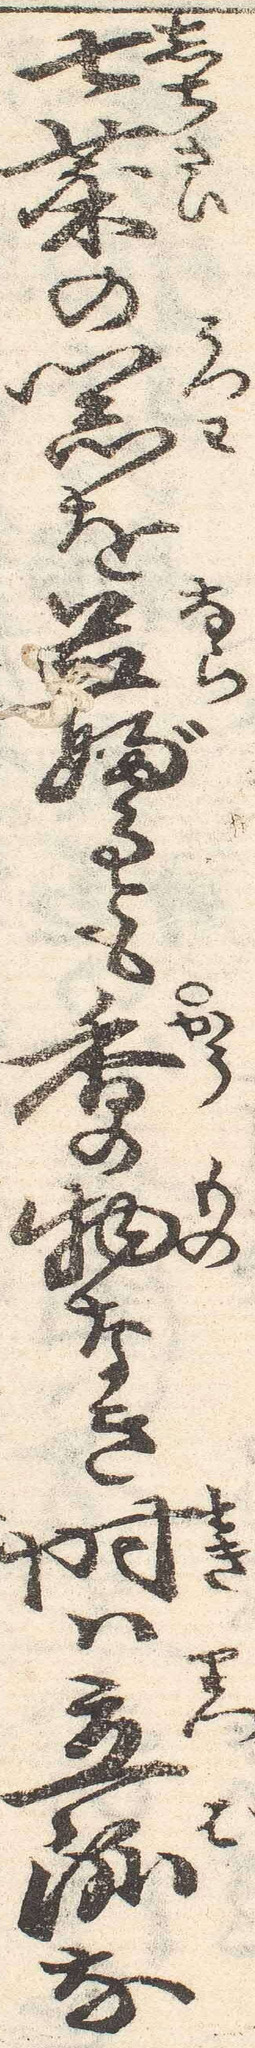七菜の器を並ぶるとも。香の物なき時は立派な
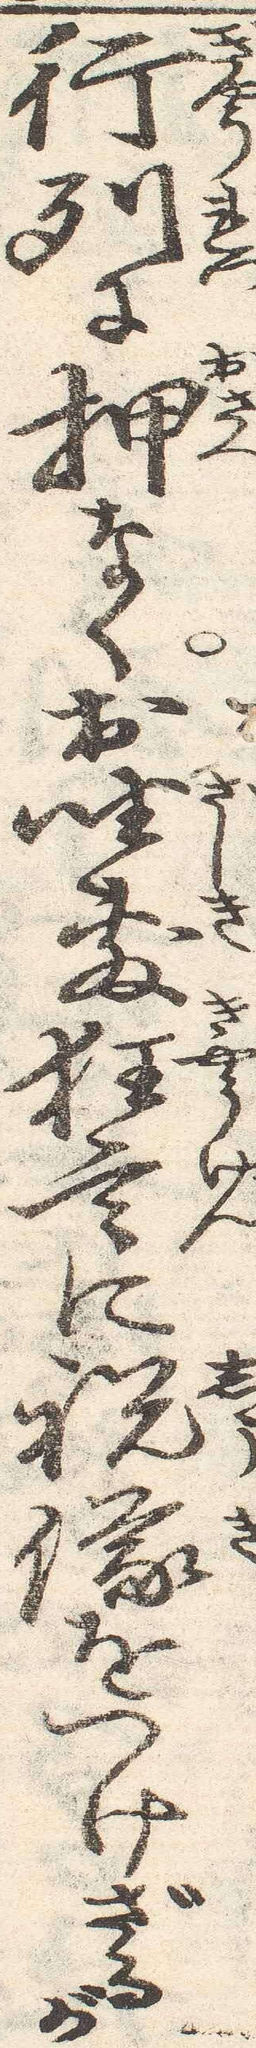行列に押なく。お座敷狂言に祝儀をつけざるが
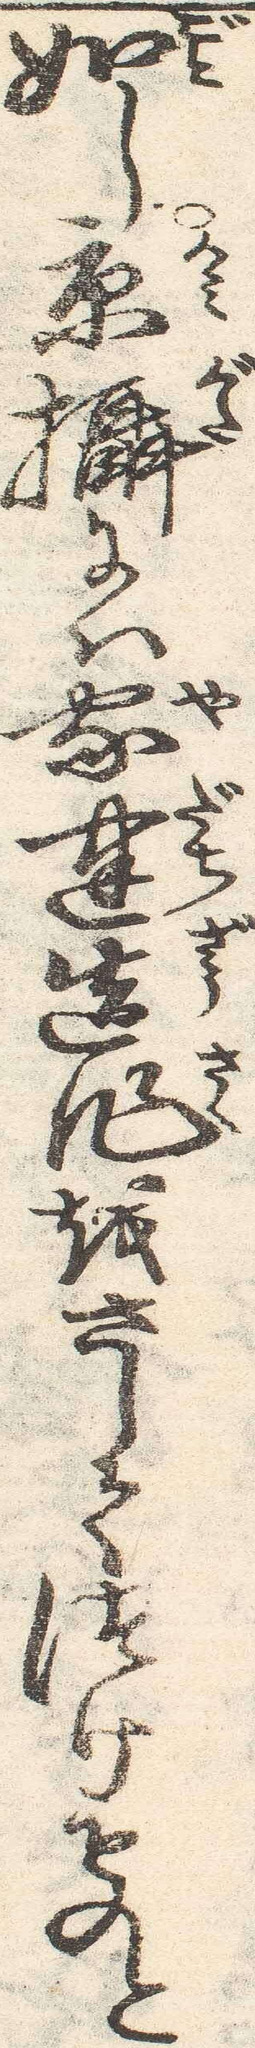如し。京摂には家建造作をさしてつけものと
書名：四季漬物塩嘉言
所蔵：東京学芸大学附属図書館 国文学研究資料館
